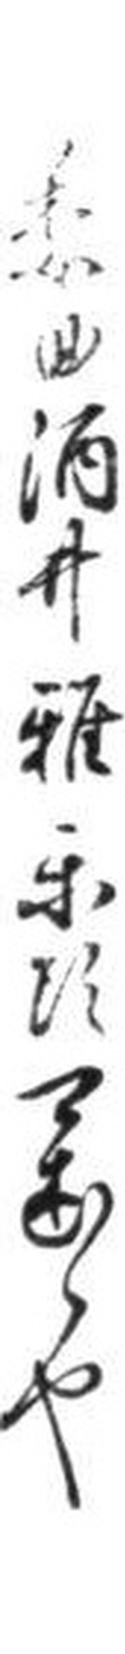委曲酒井雅楽頭可述候也
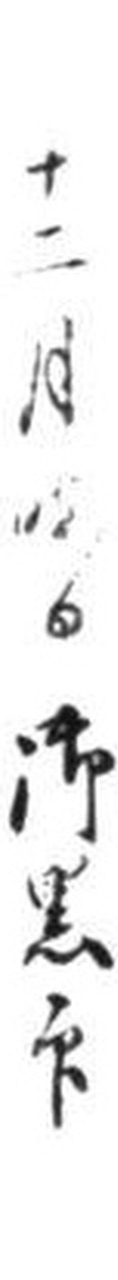十二月晦日御黒印
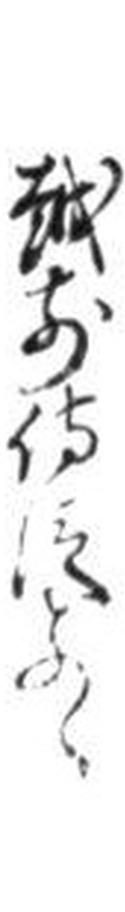越前侍従とのへ
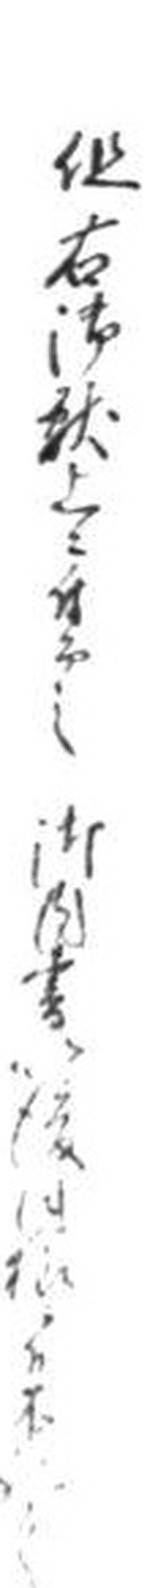但右御献上ニ付而之御内書以後同様ニ付不記之
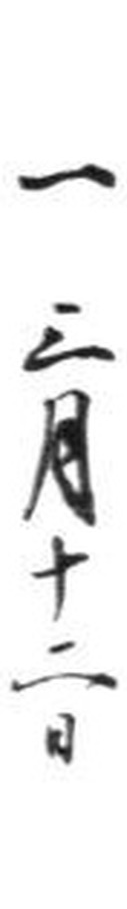一三月十二日
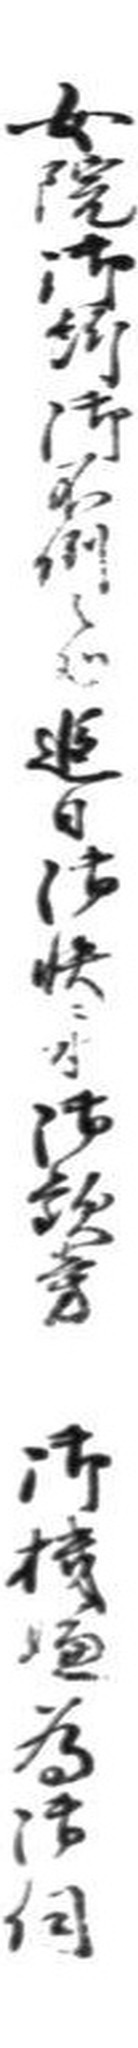女院御所御不例之処追日御快ニ付御歓旁御機嫌為御伺
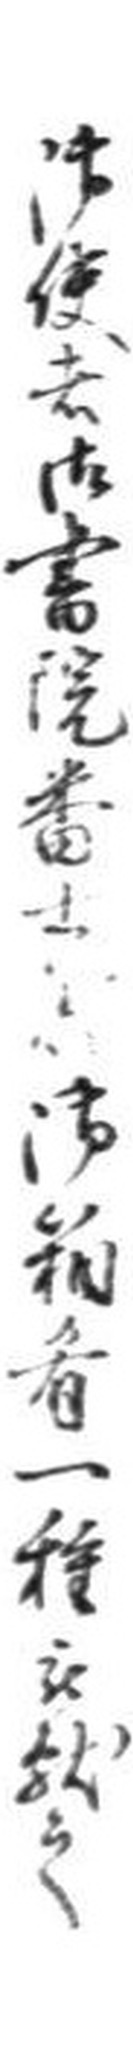御使者御書院番士を以御箱肴一種被献之
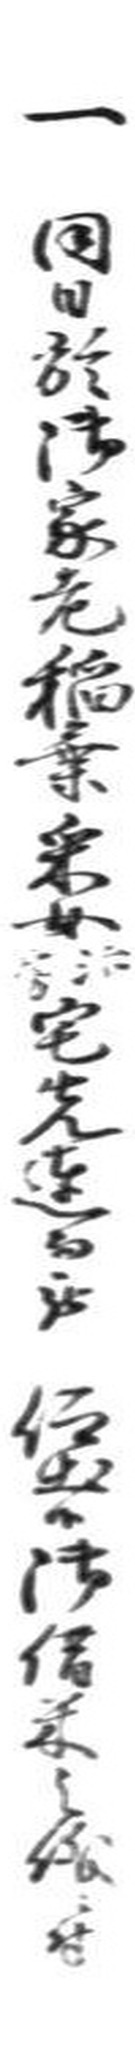一同日於御家老稲葉采女治房宅先達而被仰出候御借米之儀ニ付
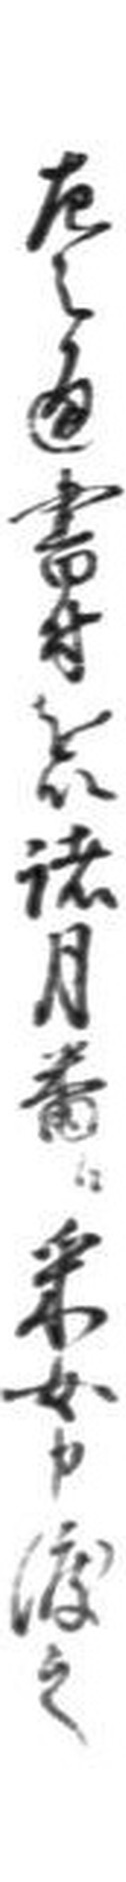左之通書付を以諸月番江采女申渡之
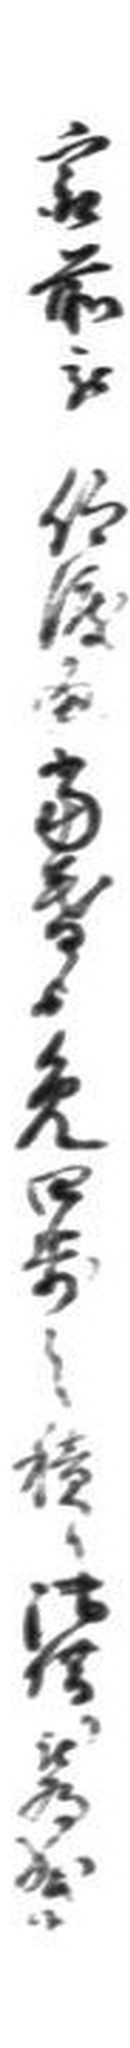最前被仰渡通当暮ゟ免四歩之積り御借り被為成候
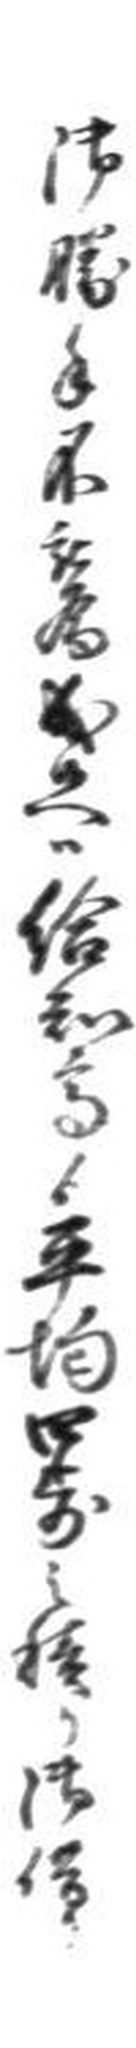御勝手不被為成候ヘハ給知高ゟ平均四歩之積り御借り
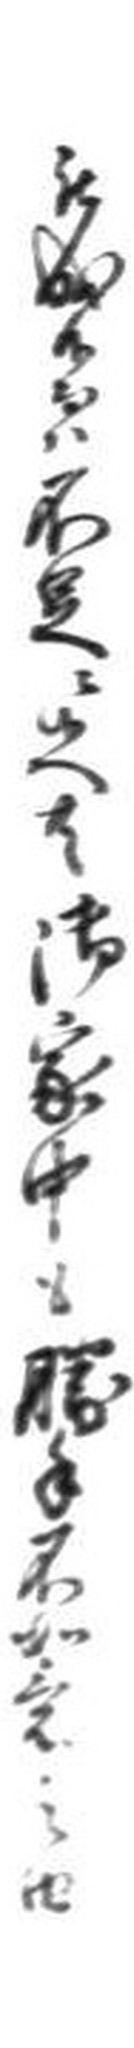被成候而ハ不足ニ候ヘ共御家中も勝手不如意之由
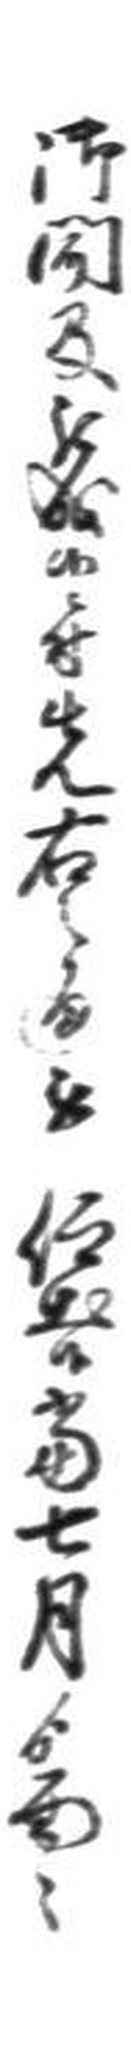御聞及被成候ニ付先右之通被仰出候当七月ゟ面々
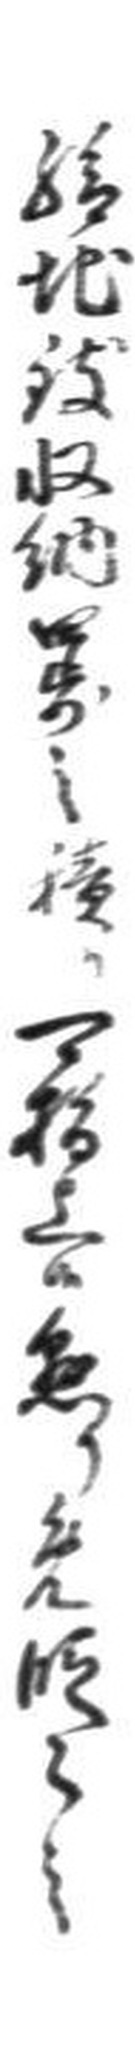給地致収納四歩之積り可指上候懸り免段々之

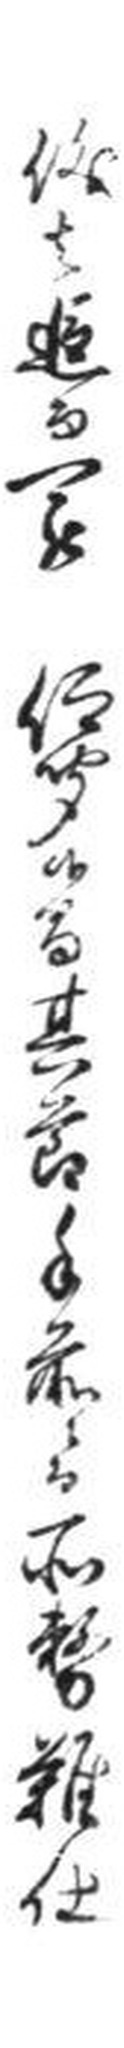儀者追而可被仰聞候間其節手前ニ而所務難仕
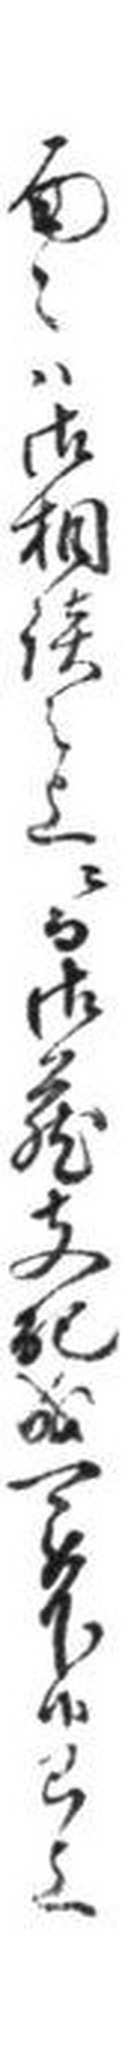面々ハ御相談之上ニ而御蔵支配成可被下候已上
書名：家譜 十三 綱昌公 従寛文元年到延宝五年
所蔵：福井県文書館 Fukui Prefectural Archives
